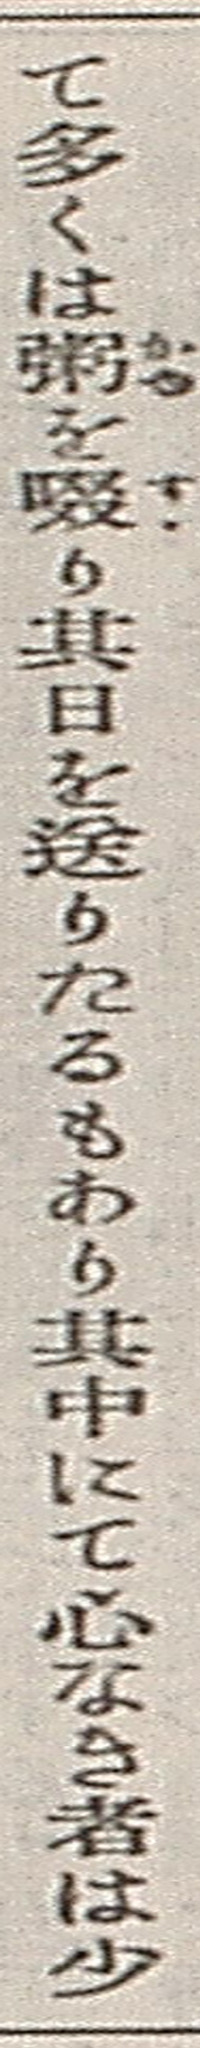て多くは粥を啜り其日を送りたるもあり其中にて心なき者は少
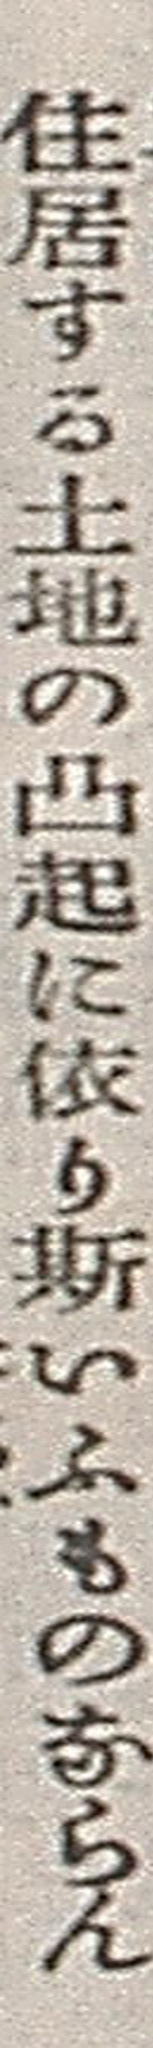住居する土地の凸起に依り斯いふものならん
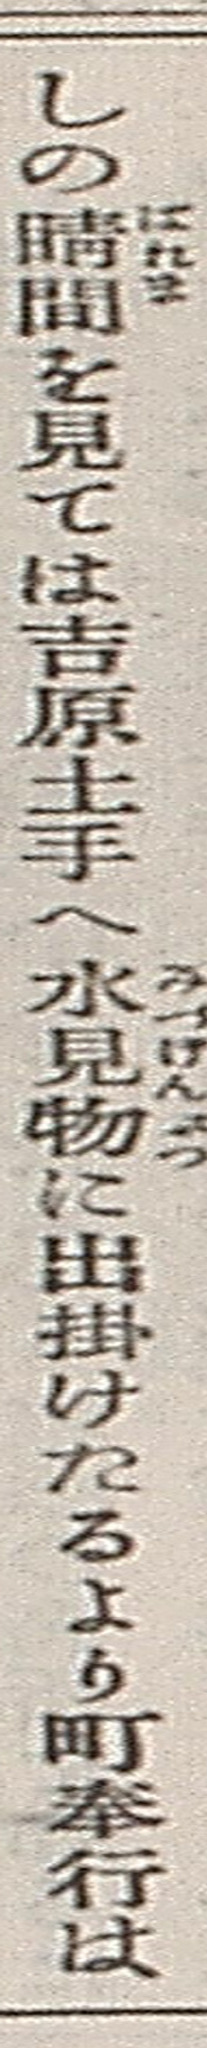しの晴間を見ては吉原土手へ水見物に出掛けたるより町奉行は
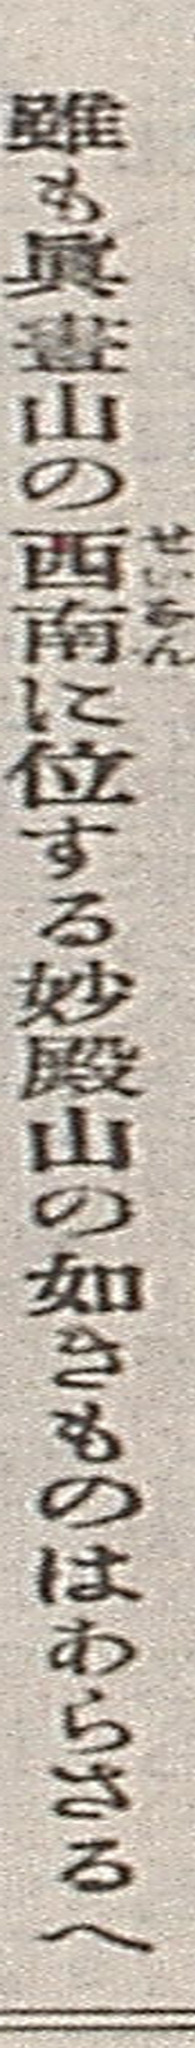雖も真昼山の西南に位する妙殿山の如きものはあらさるへ
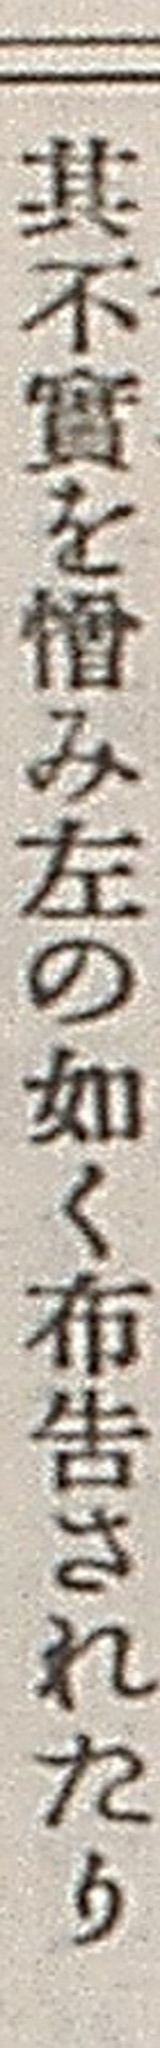其不実を憎み左の如く布告されたり
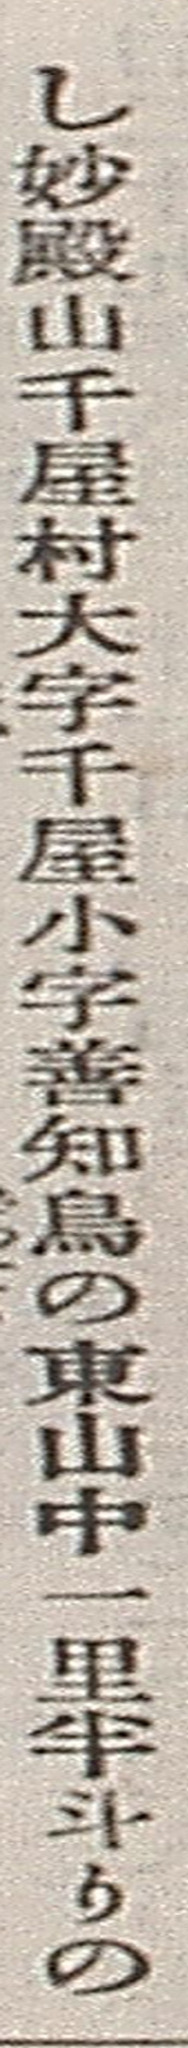し妙殿山千屋村大字千屋小字善知鳥の東山中一里半斗りの
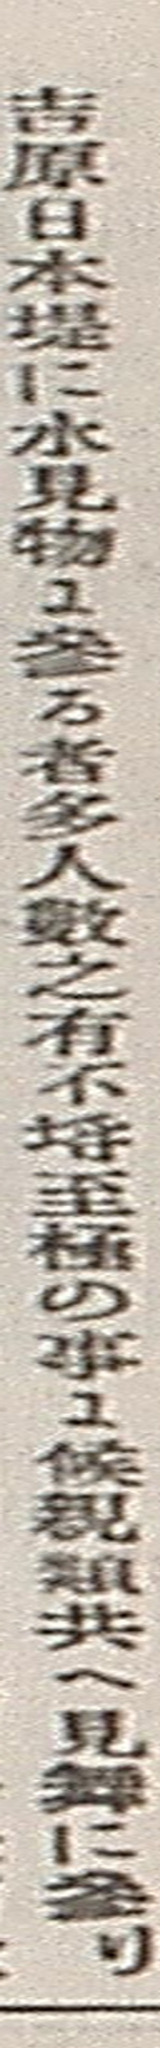吉原日本堤に水見物に参る者多人数之有不埒至極の事に候親類共へ見舞に参り
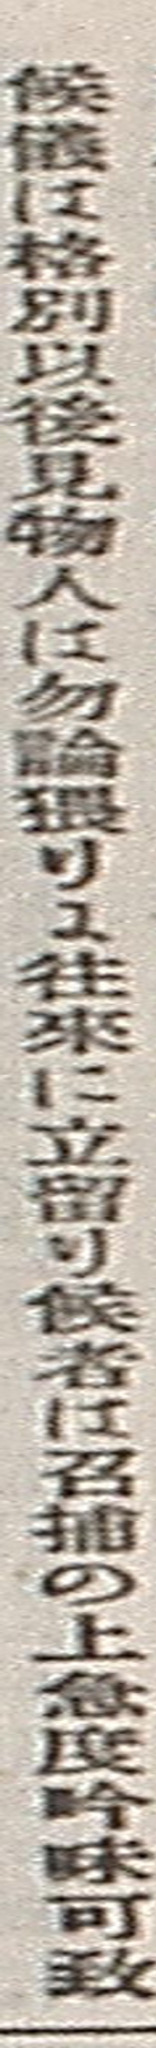候儀は格別以後見物人は勿論猥りに往来に立留り候者は召捕の上急度吟味可致
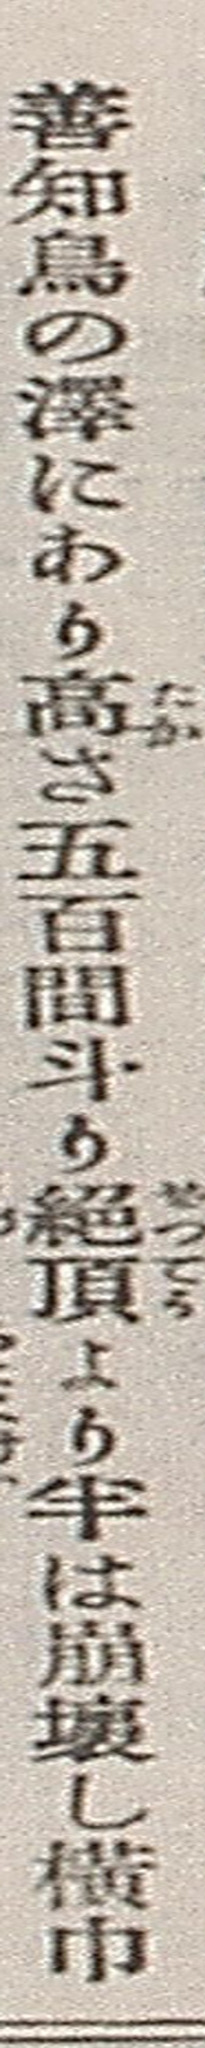善知鳥の沢にあり高さ五百間斗り絶頂より半は崩壊し横巾
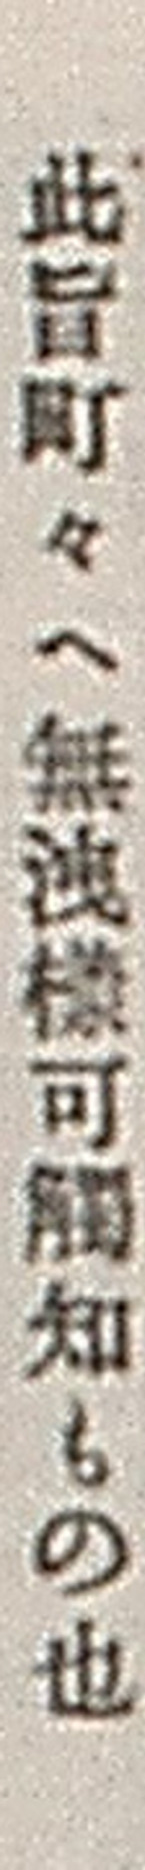此旨町々へ無洩様可触知もの也
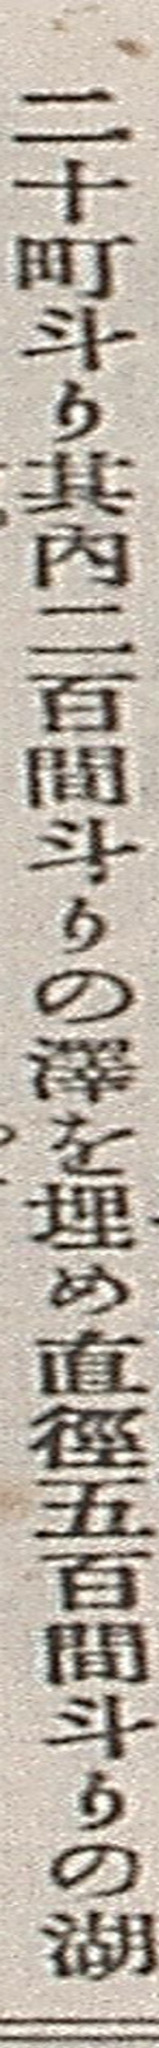二十町斗り其内二百間斗りの沢を埋め直径五百間斗りの湖
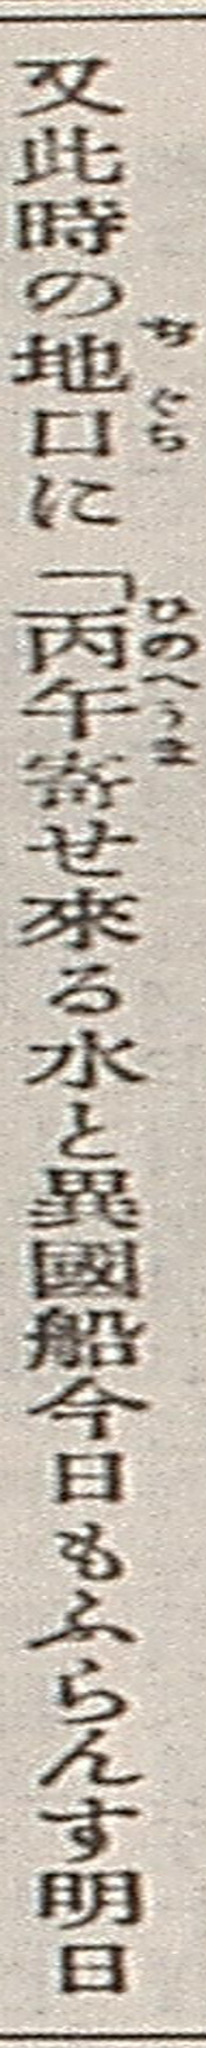又此時の地口に「丙午寄せ来る水と異国船今日もふらんす明日
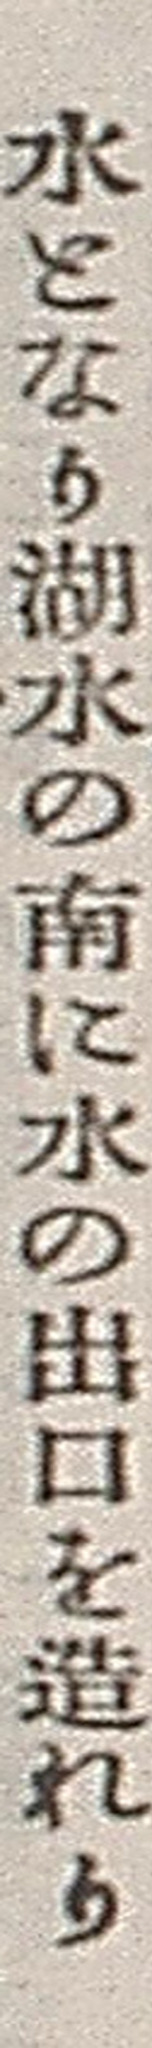水となり湖水の南に水の出口を造れり
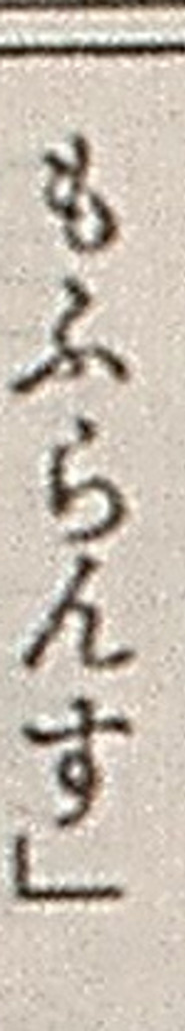もふらんす」
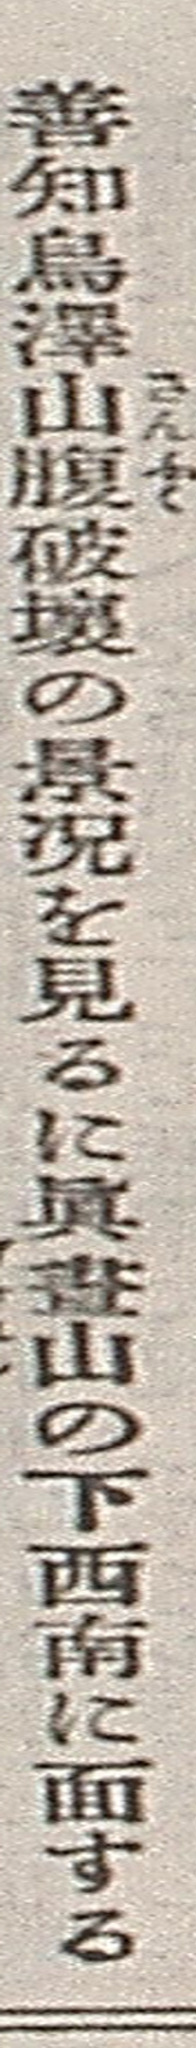善知鳥沢山腹破壊の景況を見るに真昼山の下西南に面する
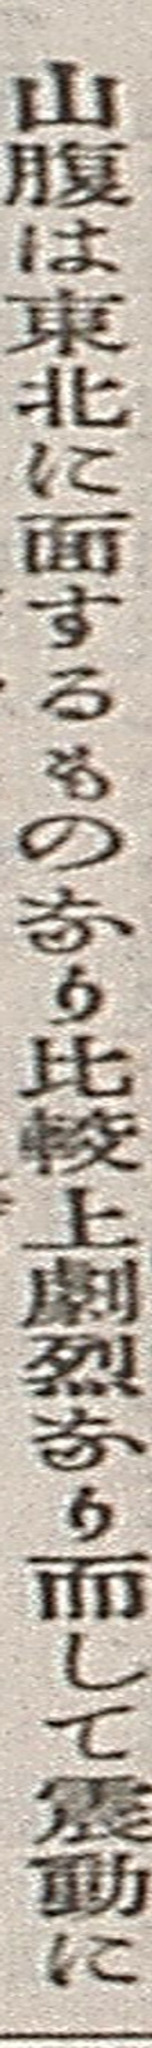山腹は東北に面するものなり比較上劇烈なり而して震動に
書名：風俗畫報臨時増刊第百二十四號　洪水地震被害録（上）
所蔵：東京大学地震研究所図書室 Earthquake Research Institute Library, The University of Tokyo, JAPAN
